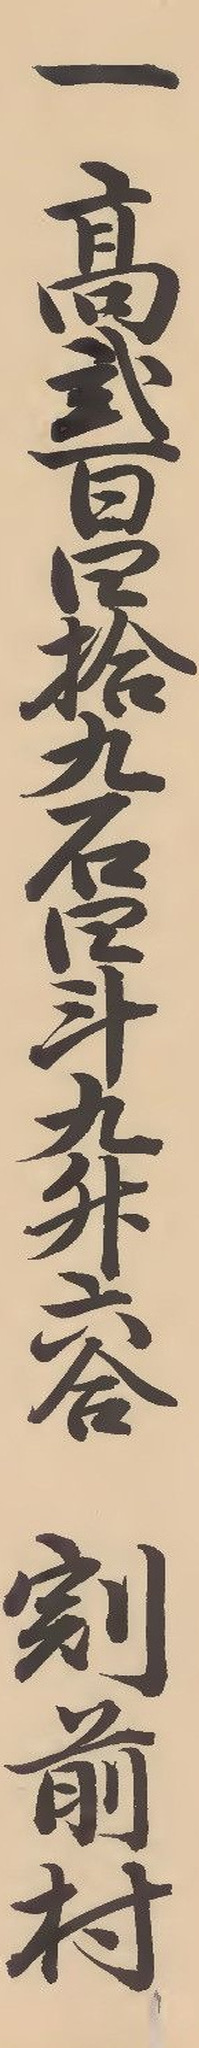一高弐百四拾九石四斗九升六合割前村
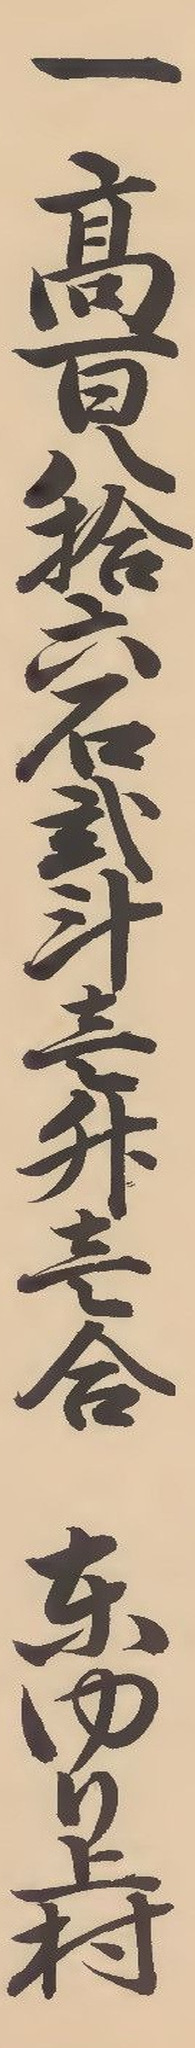一高百八拾六石弐斗壱升壱合東ゆり上村
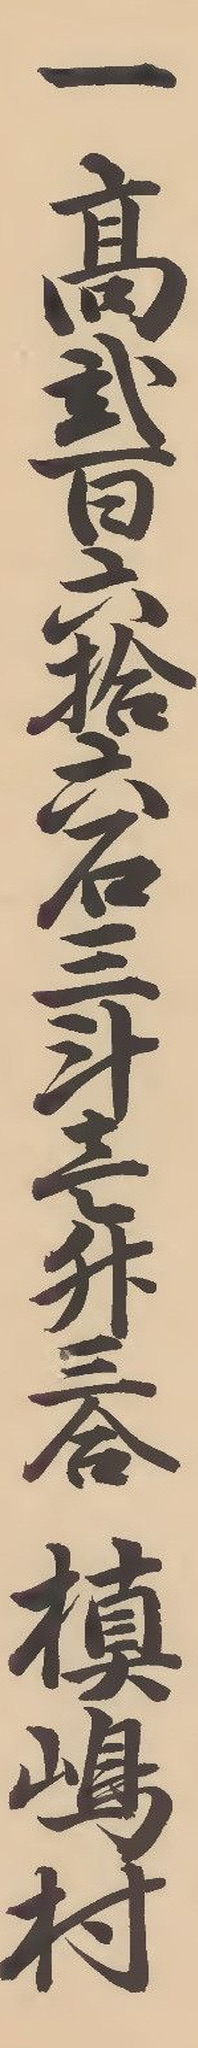一高弐百六拾六石三斗壱升三合槙島村

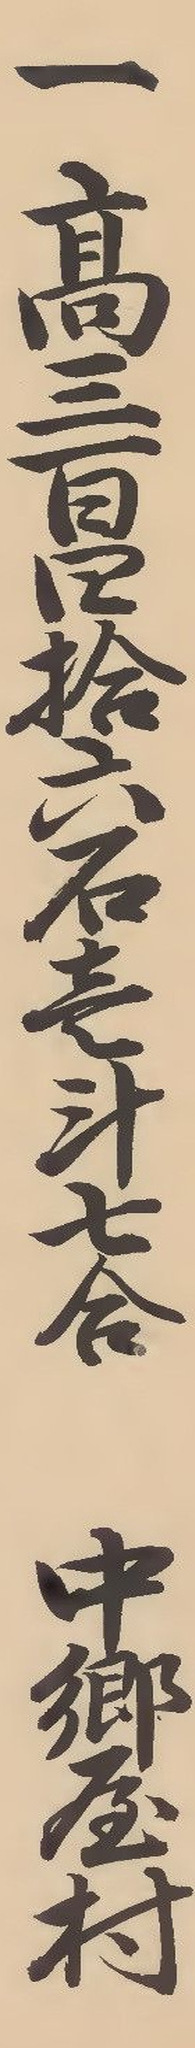一高三百四拾六石壱斗七合中郷屋村
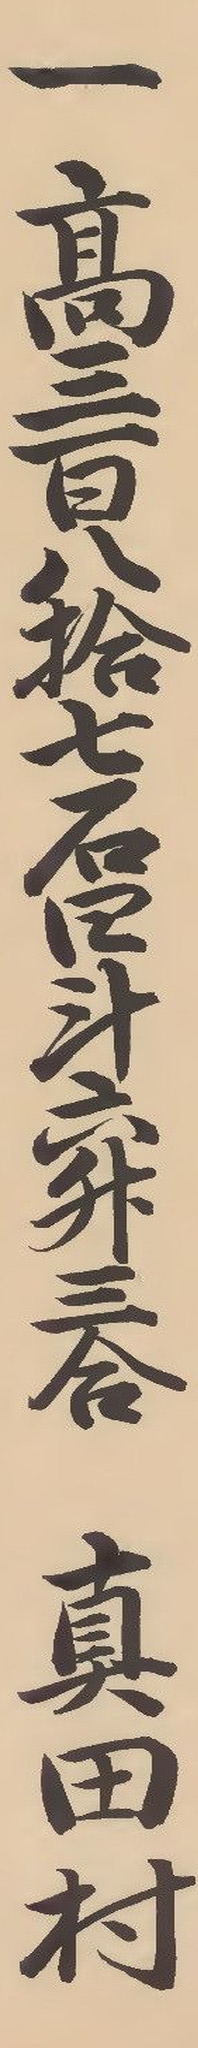一高参百八拾七石四斗六升三合真田村
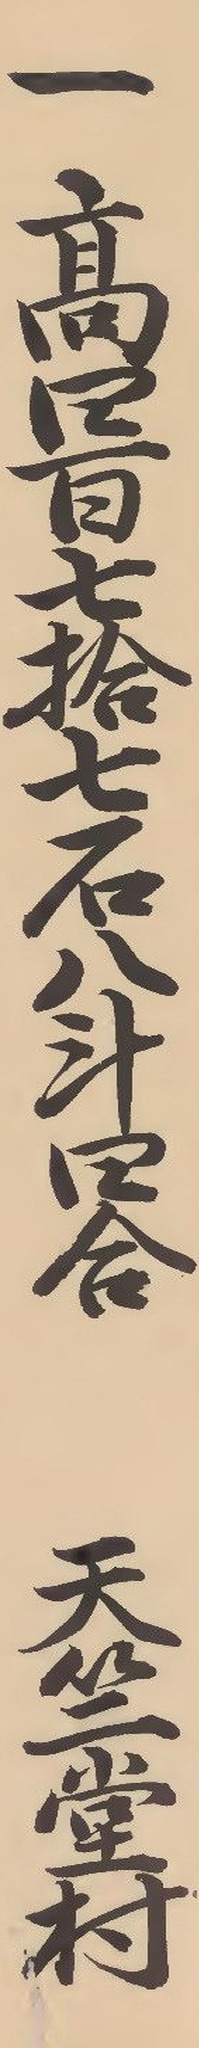一高四百七拾七石八斗四合天竺堂村
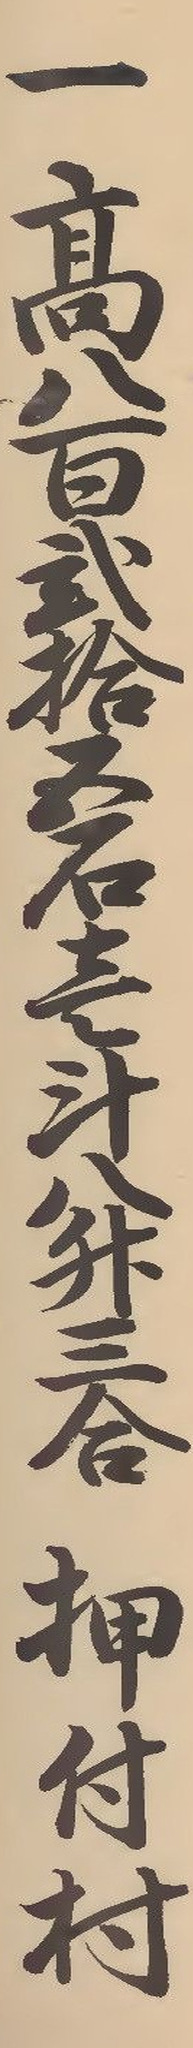一高八百弐拾五石壱斗八升三合押付村
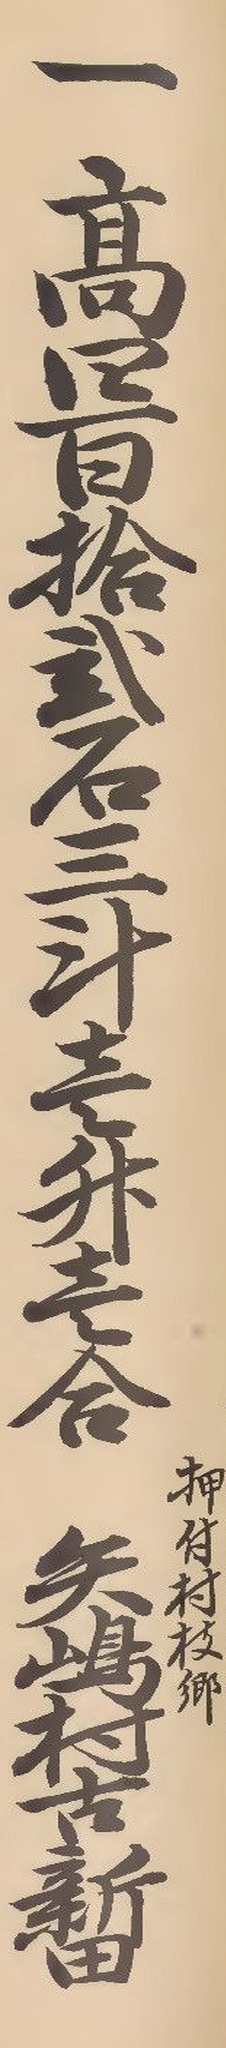一高四百拾弐石三斗壱升壱合矢島村古新田
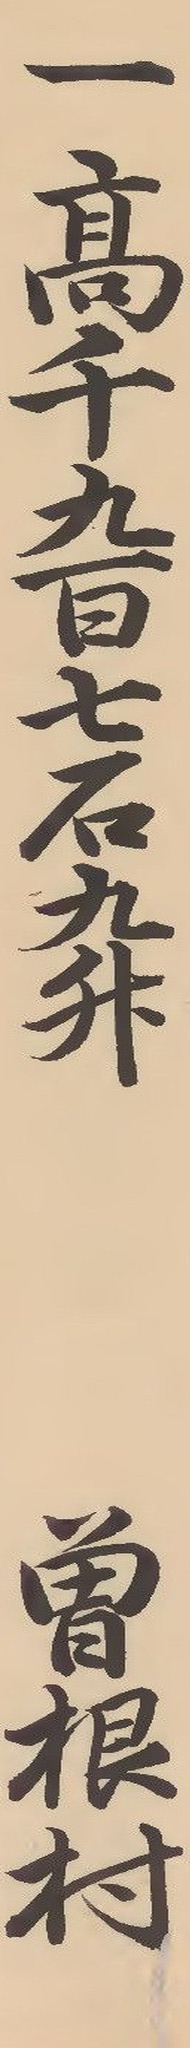一高千九百七石九升曽根村
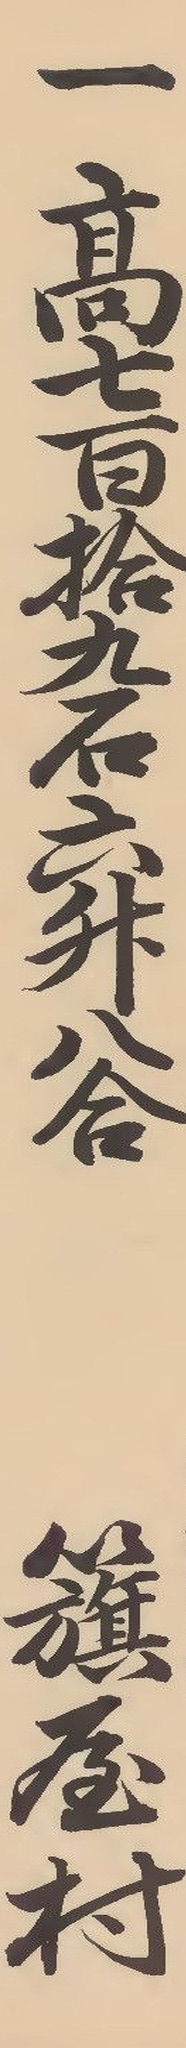一高七百拾九石六升八合籏屋村
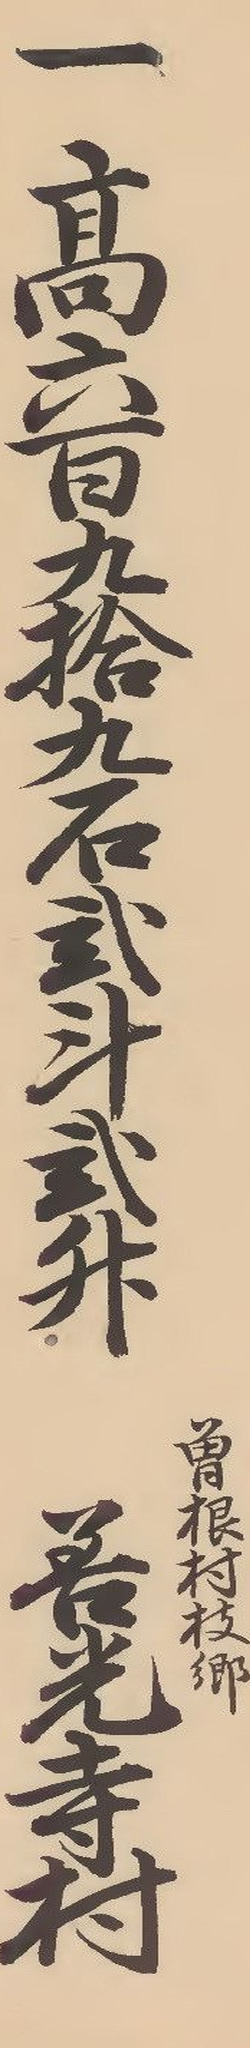一高六百九拾九石弐斗弐升善光寺村

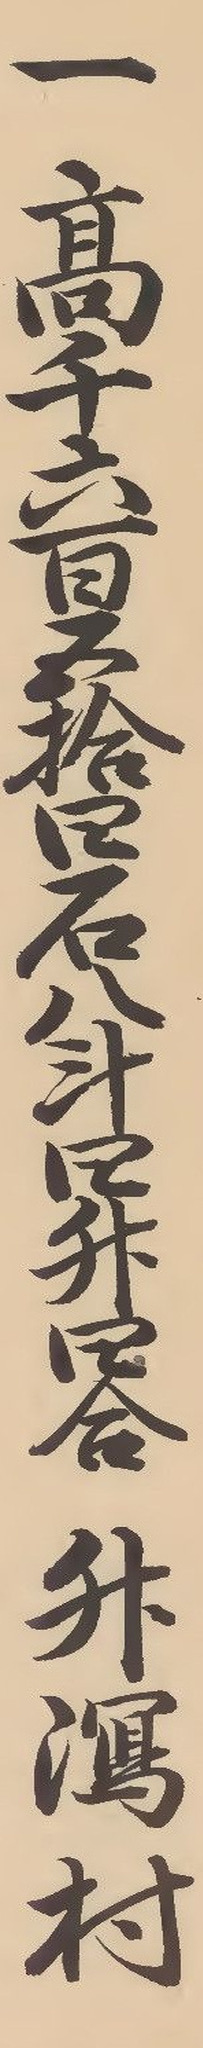一高千六百五拾四石八斗四升四合升潟村
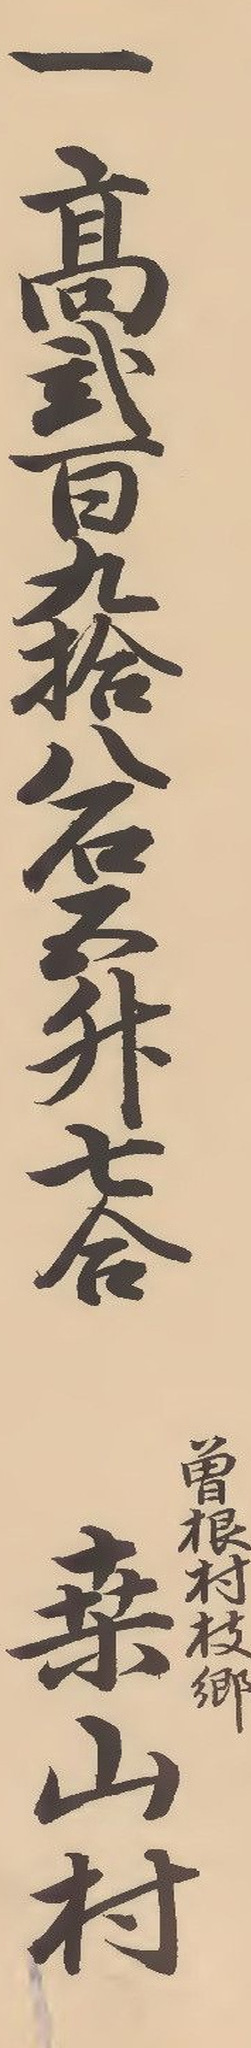一高弐百九拾八石五升七合桑山村
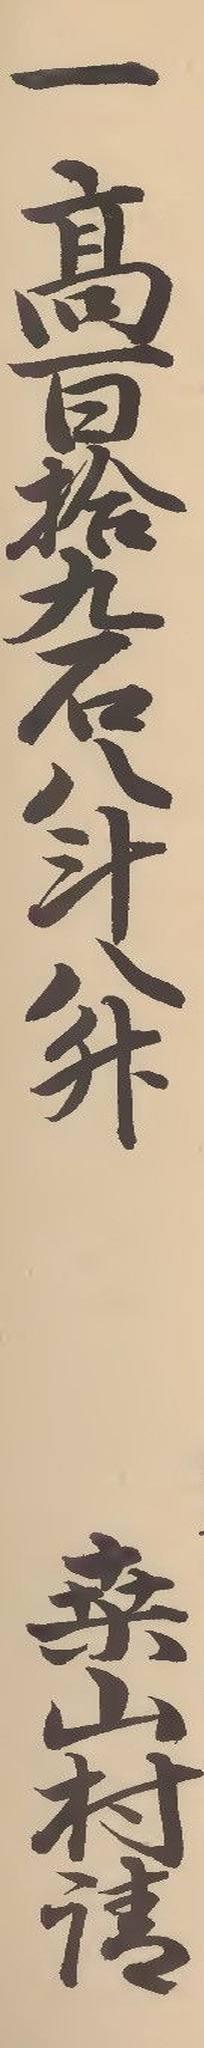一高百拾九石八斗八升桑山村請
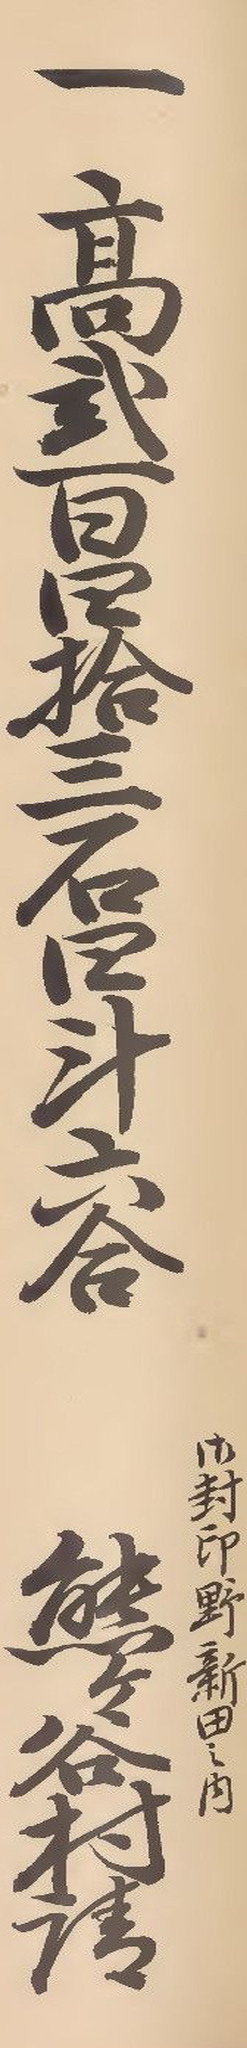一高弐百四拾三石四斗六合熊ヶ谷村請
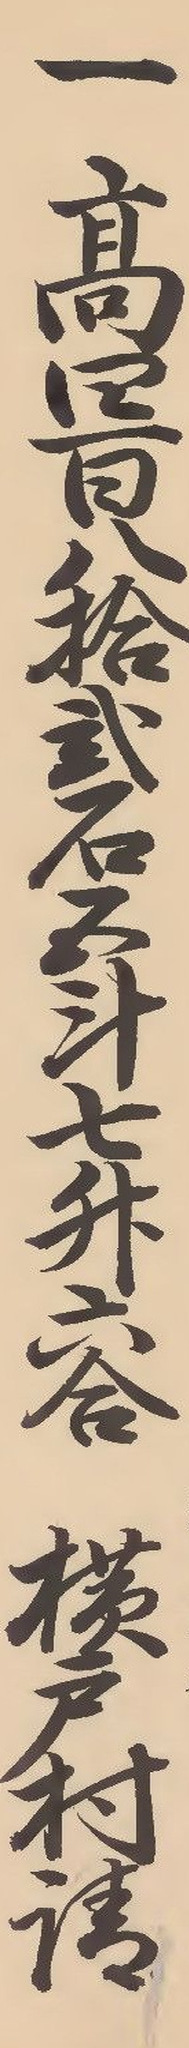一高四百八拾弐石五斗七升六合横戸村請
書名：越後国郷帳　下
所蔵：国立公文書館 National Archives of Japan
